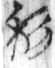利（利）
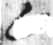㠯（以）
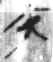內（入）
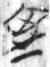室
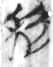利（利）
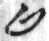㠯（以）
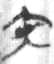內（入）
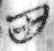田
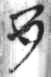邑
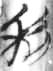利（利）
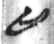㠯（以）
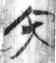內（入）
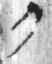人
